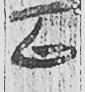㠯（以）
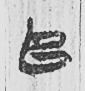𠂤
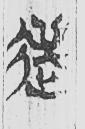逆
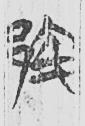○（蔡）
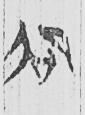卲
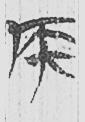侯
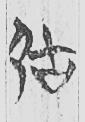居
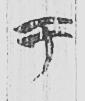于
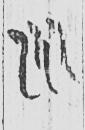州
